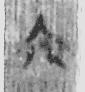六
